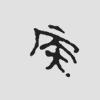矦
